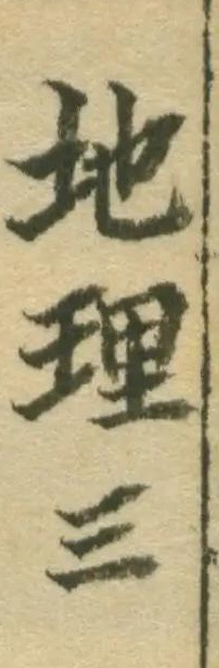地理三
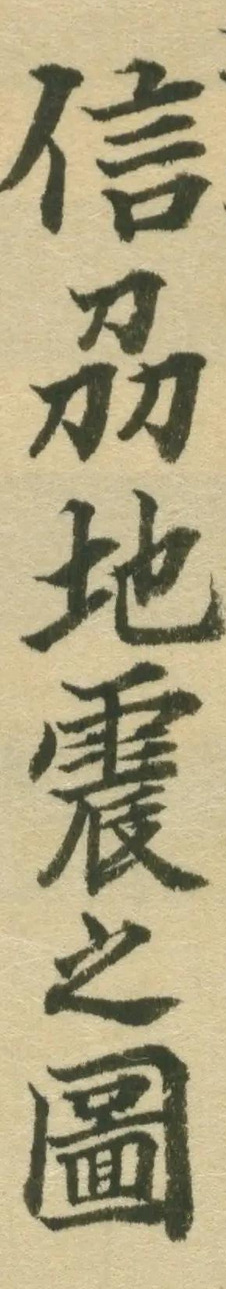信刕地震之圖
